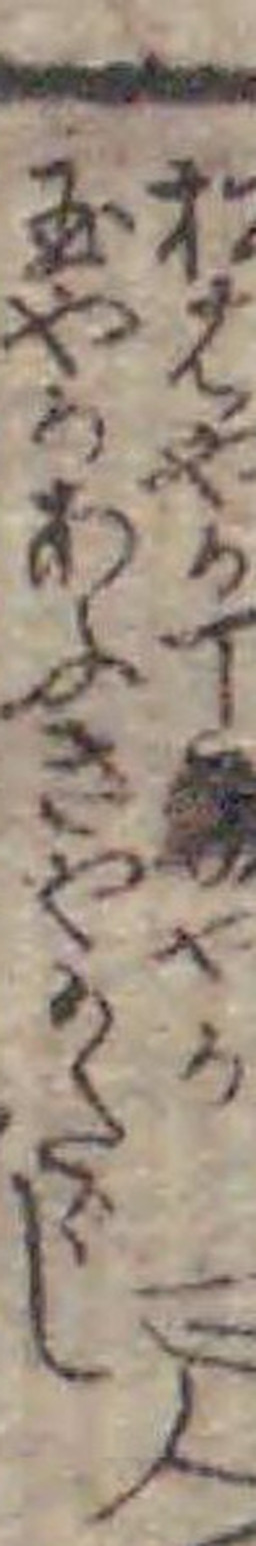玉やかあふきやかたゞし
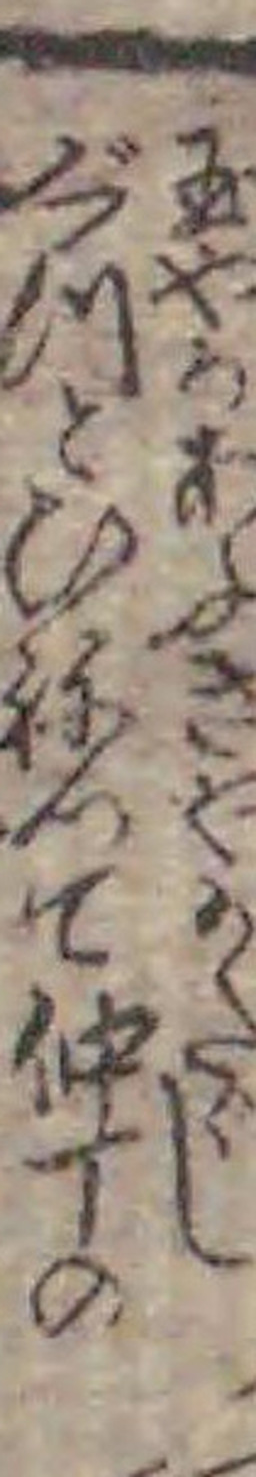ぐつとひねつて仲丁の
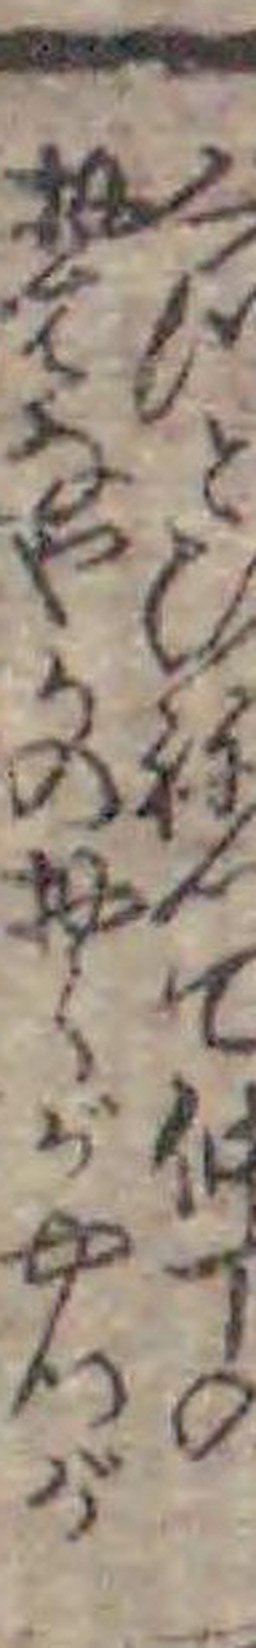おはなやかのおらがやつが
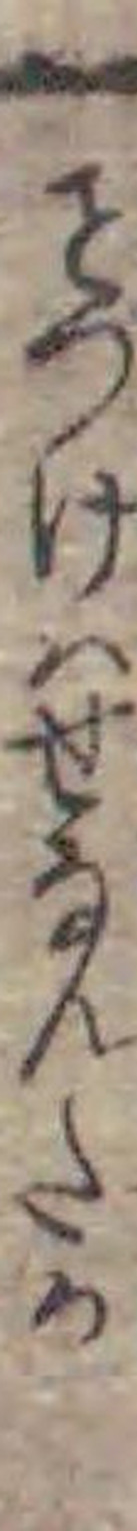ことづけはせなんたか
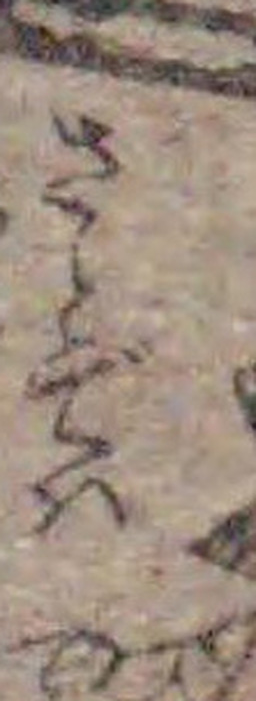さとでは

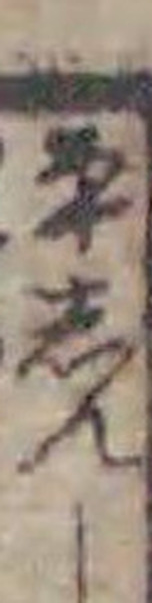平しん
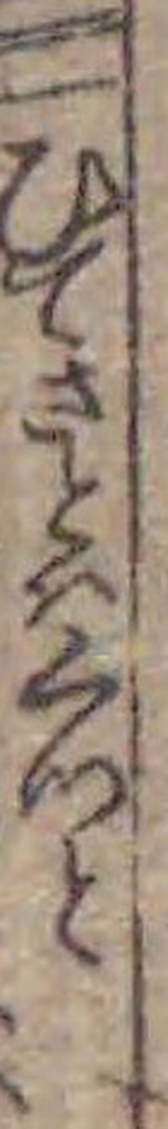ひてさとはくつと
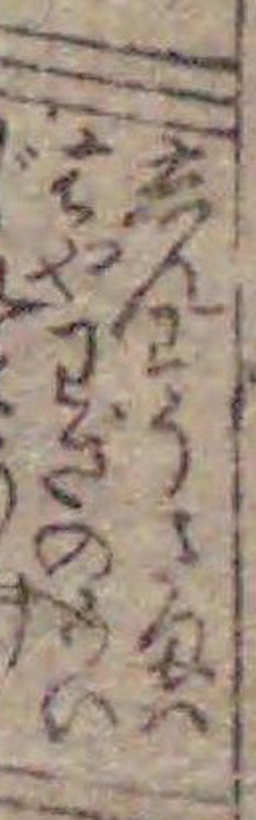はやわざのめい
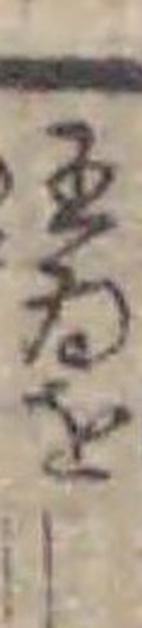王ゐを
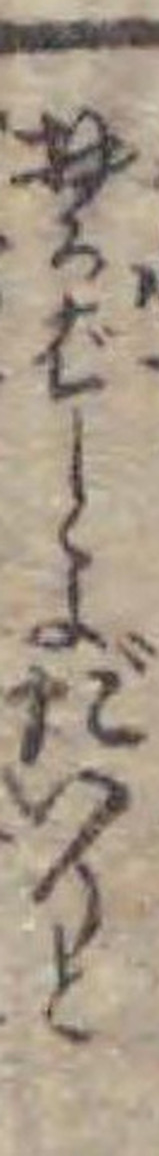おかばしよだいりと
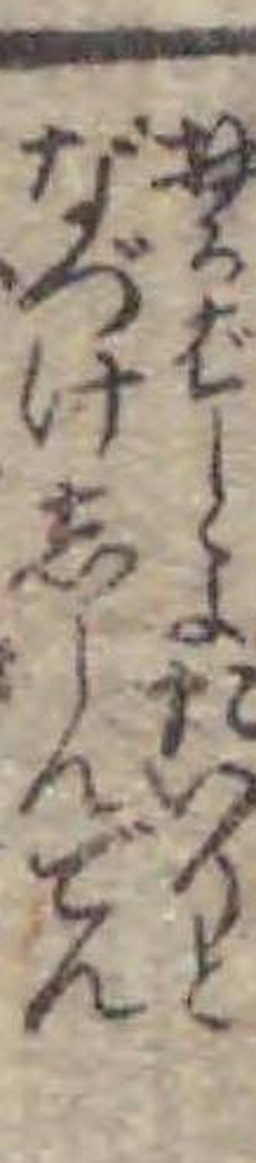なづけしんでん
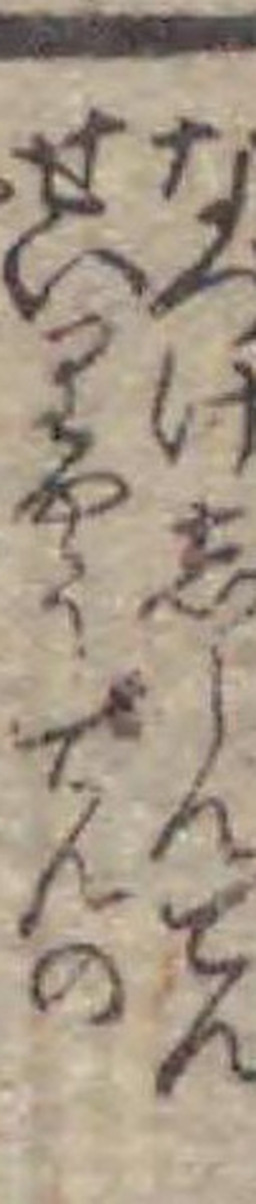せいりやうでんの
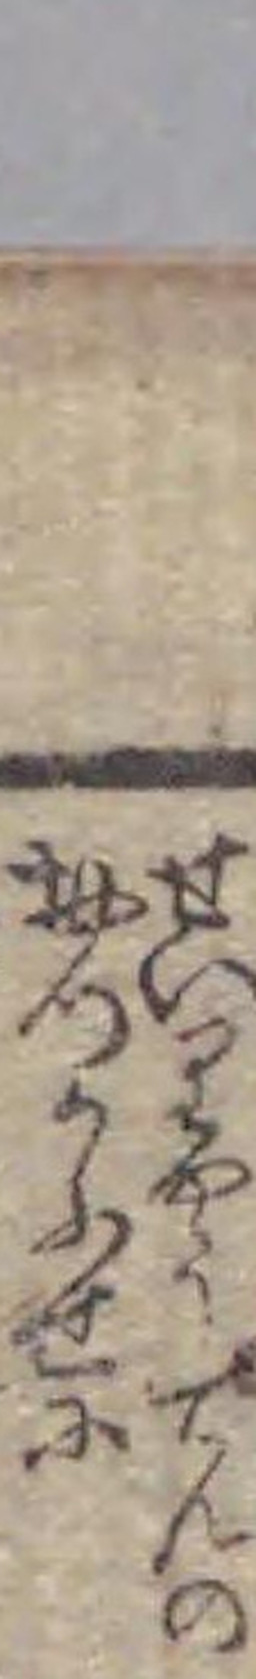おつかふせに
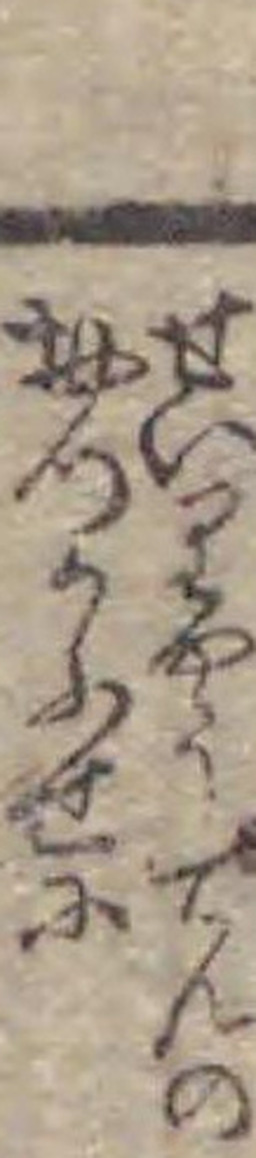おつかふせに
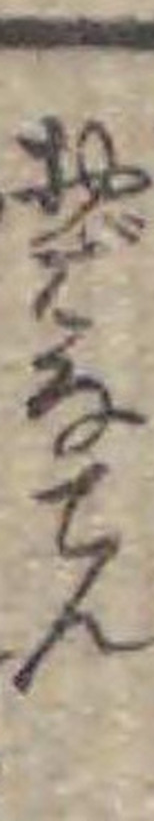おばなてん
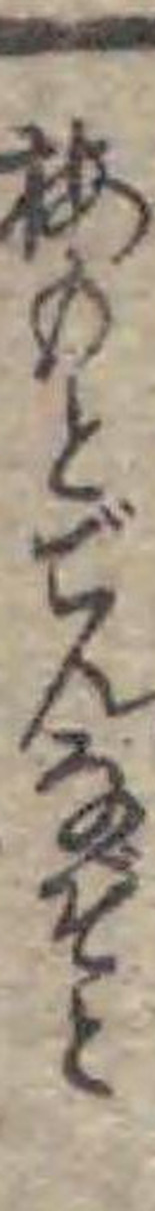梅もとでんなぞと
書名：時代世話二挺皷 : 2巻
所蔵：国立国会図書館 National Diet Library, JAPAN
